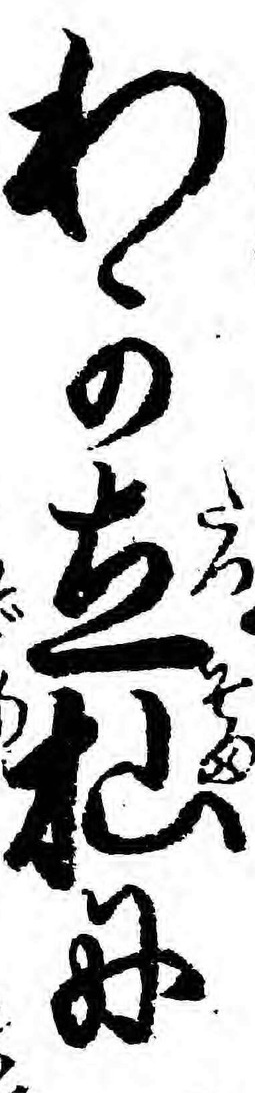わか立杣に
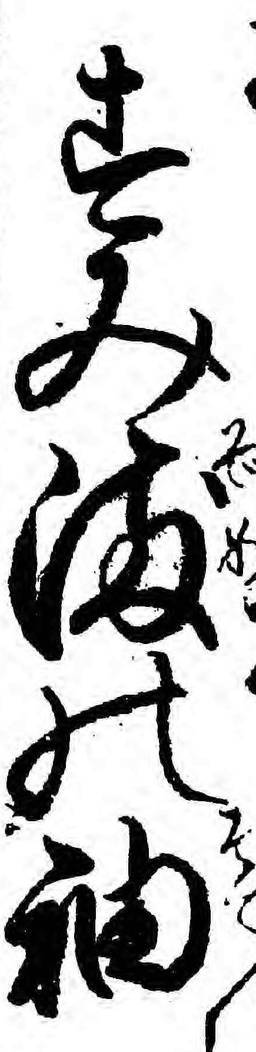すみ染の袖

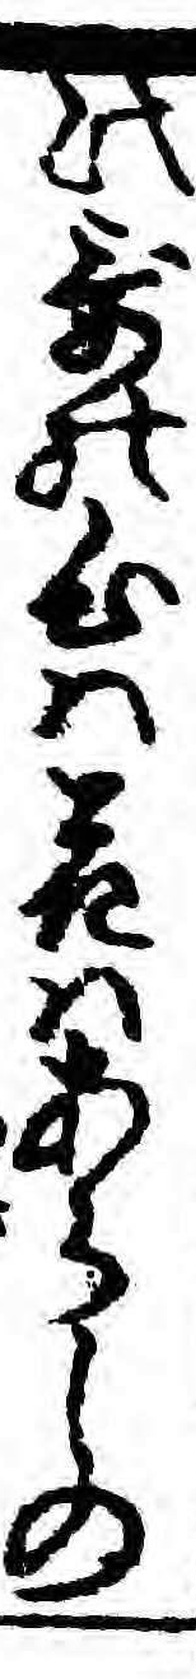此哥の心は花はあらしの
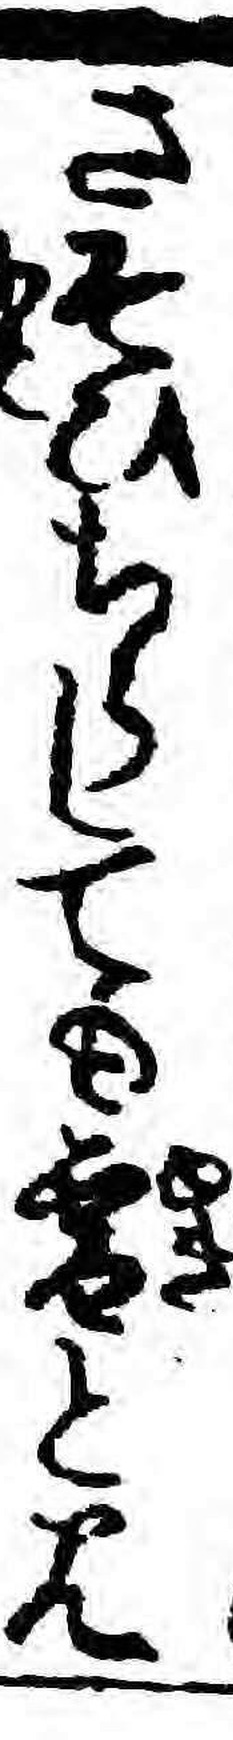さそひちらしても雪と見
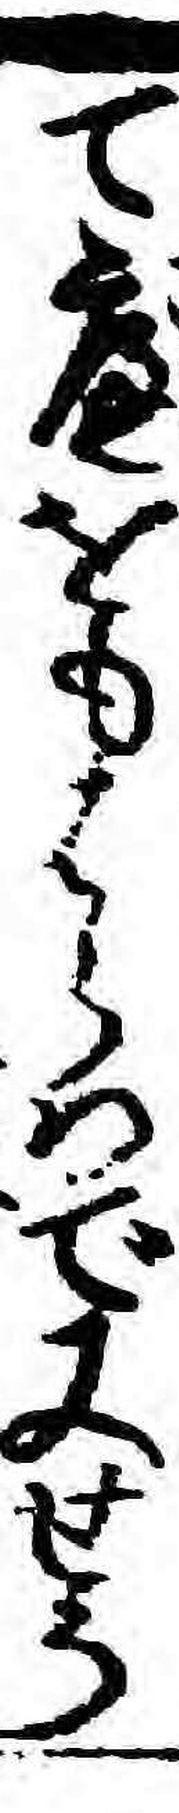て庭をもはらはで又せう
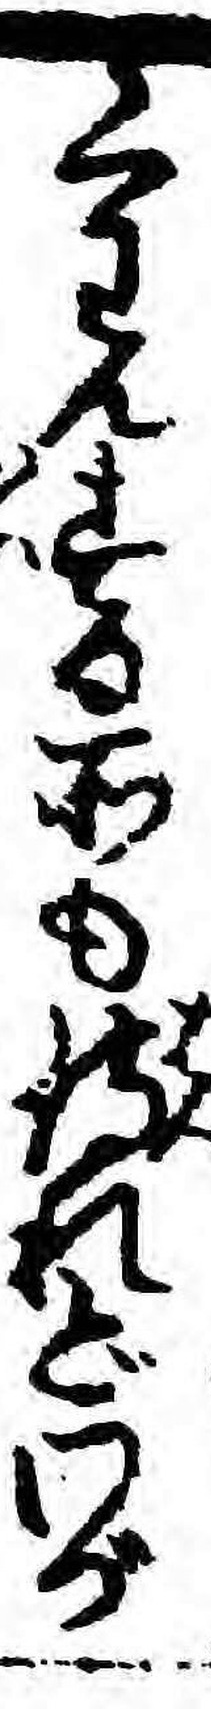くわんする所も侍れどわが
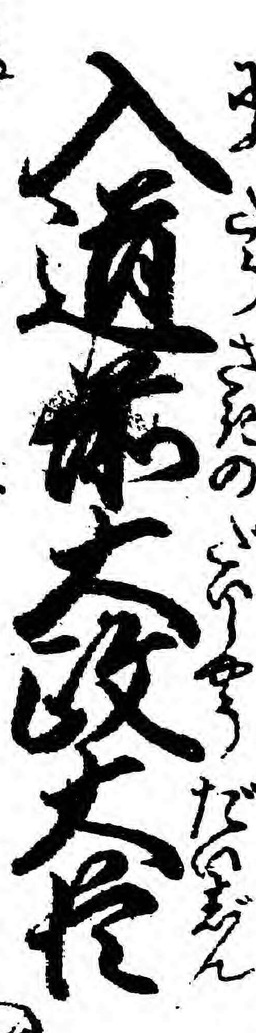入道前太政大臣
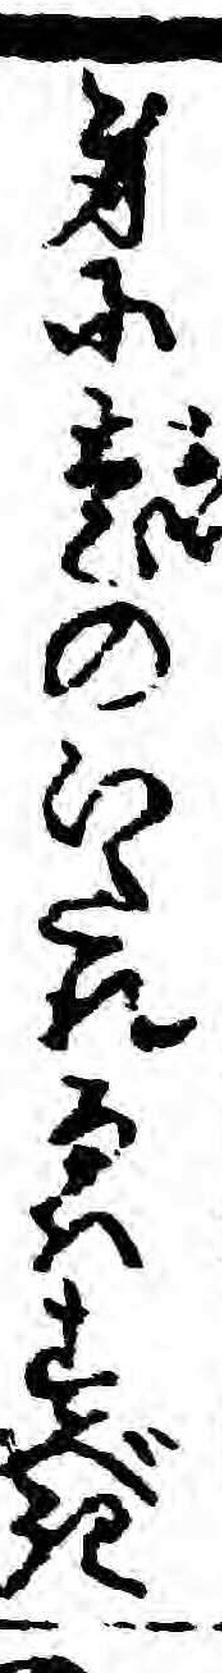身に老のいたれるはすべき
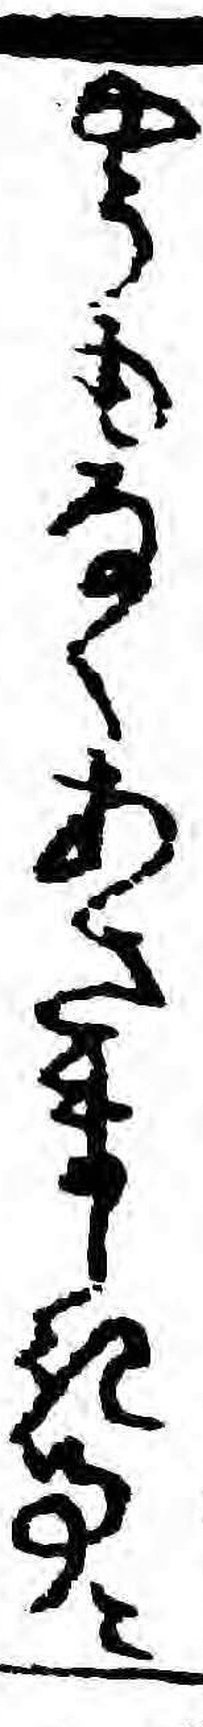やうもなくあさましきことに
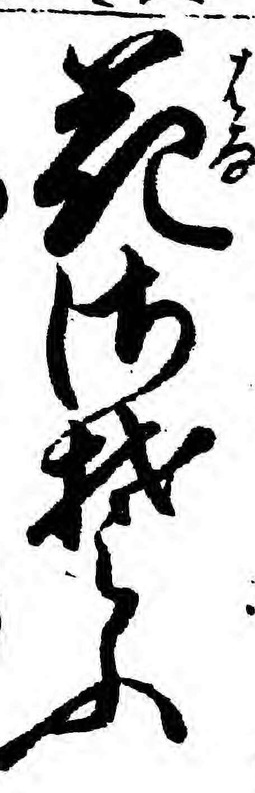花さそふ
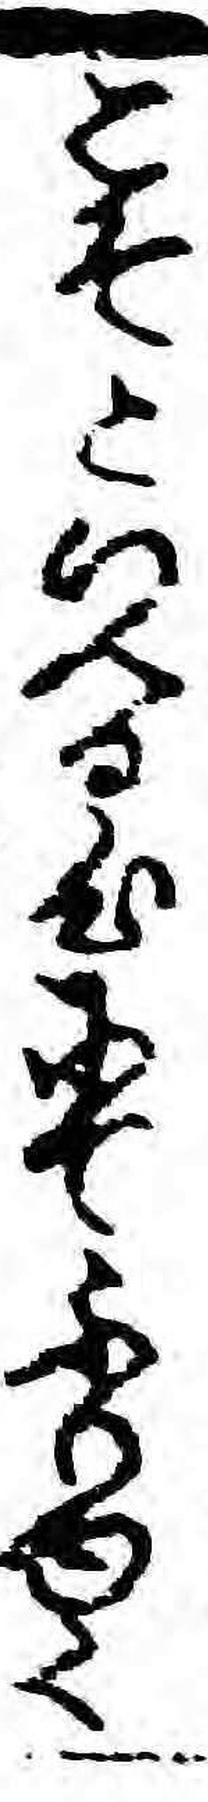こそといへる心にてふりゆく
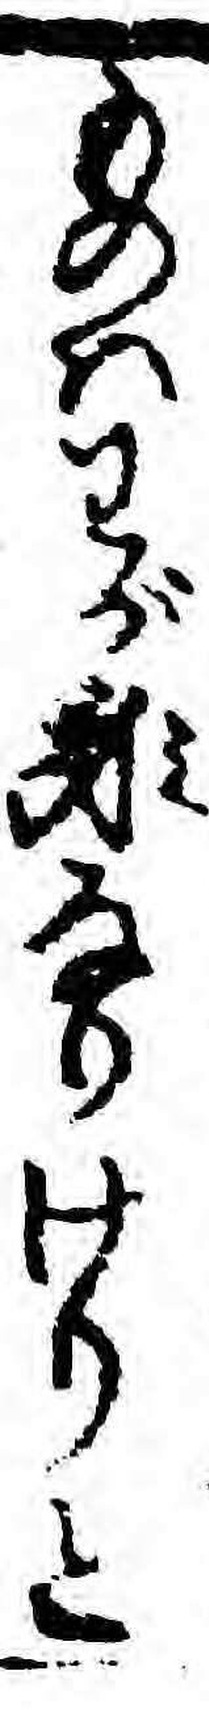ものはわが身なりけりと
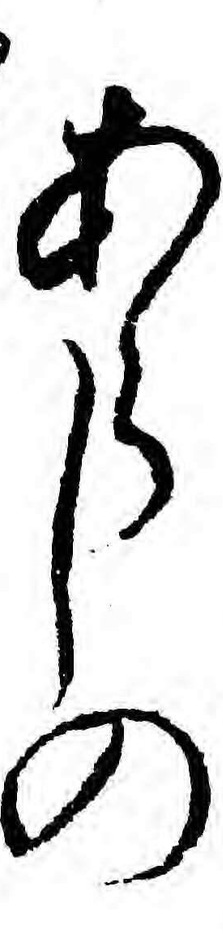あらしの
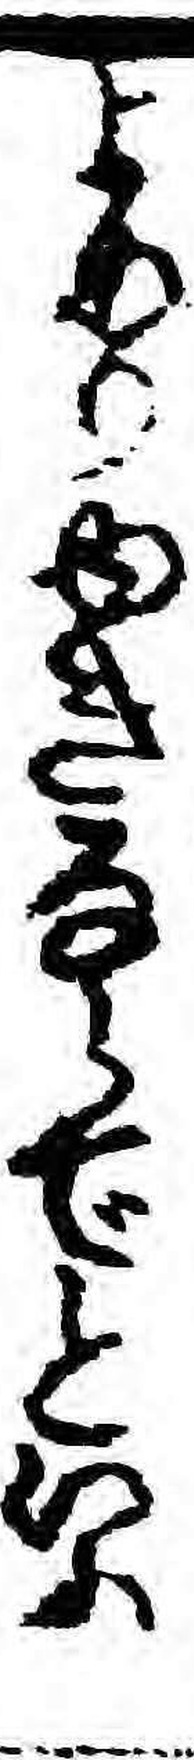よめりゆきならでといふ
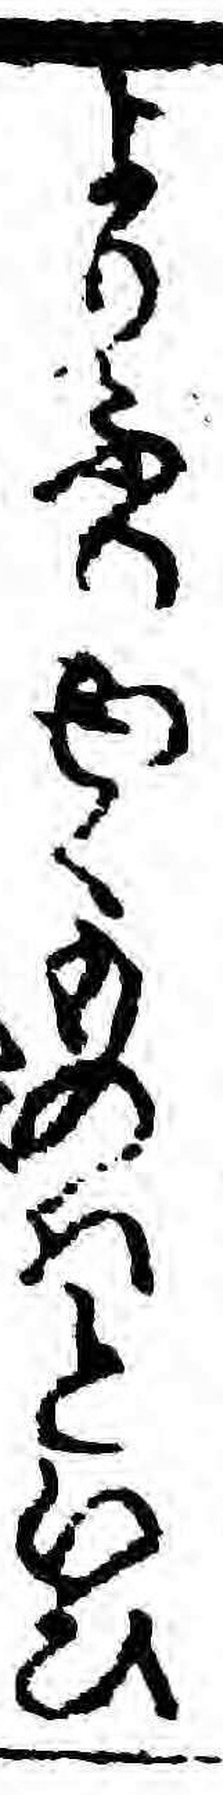よりふりゆくものはといひ
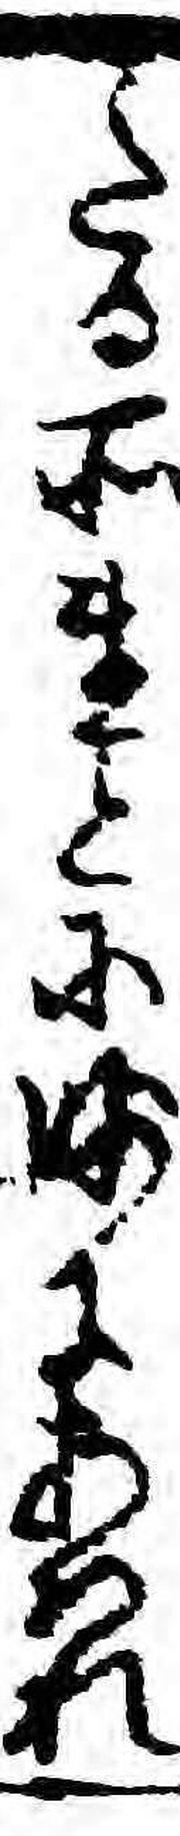たる所まことに妙にあはれ
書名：頭書和歌注譯／壽賀多百人一首小倉錦
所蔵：国文学研究資料館
